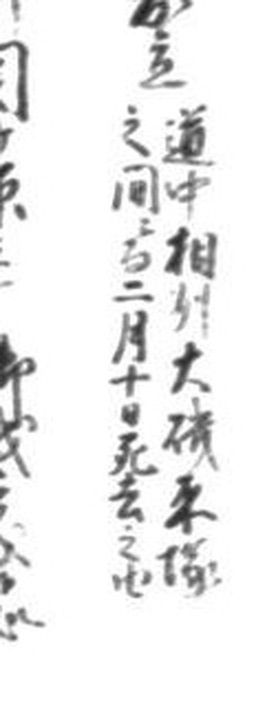之間ニ而二月十日死去之由
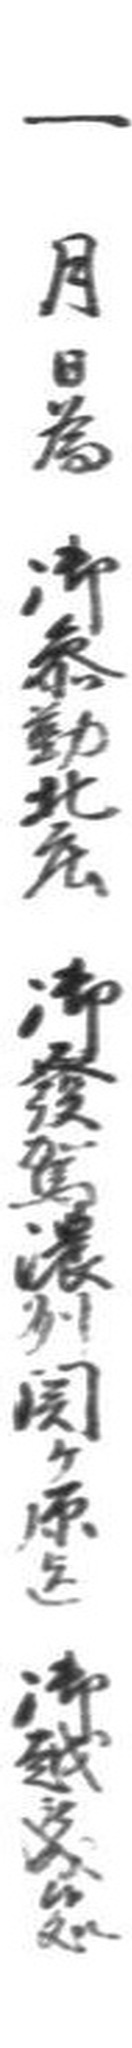一月日為御参勤北庄御発駕濃州関ケ原迄御越被成候処
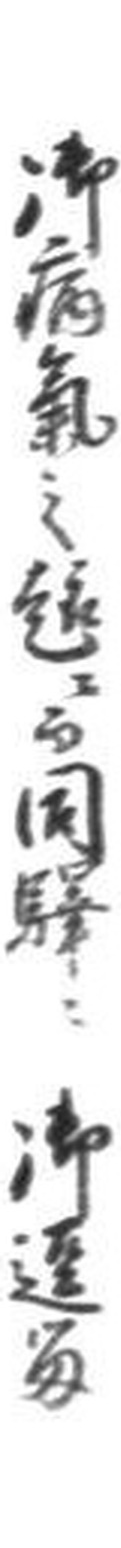御病気之趣ニ而同駅ニ御逗留
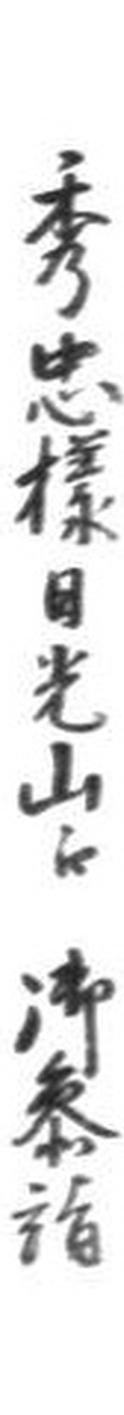秀忠様日光山江御参詣

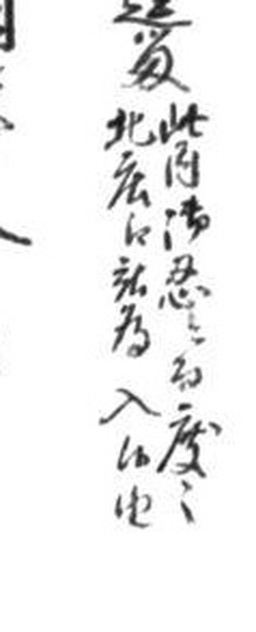北庄江被為入候由
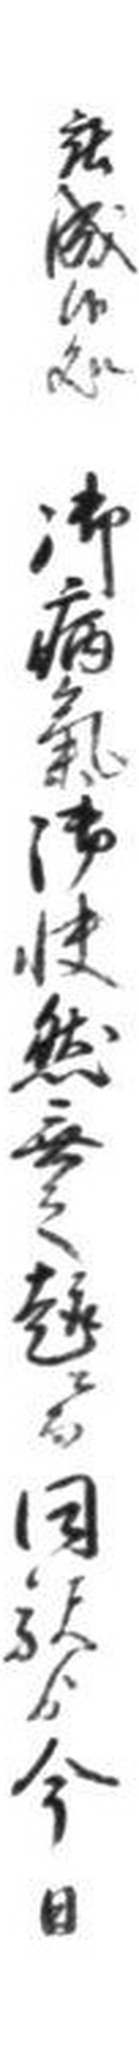被成候処御病気御快然無之趣ニ而同駅ゟ今日
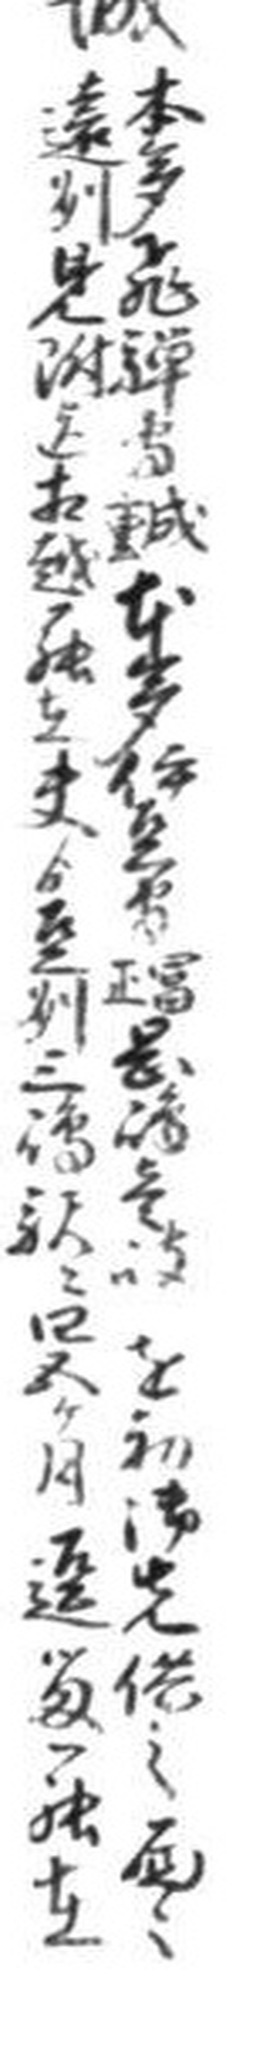遠州見附迄相越罷在夫ゟ豆州三嶋駅ニ四五ケ月逗留罷在
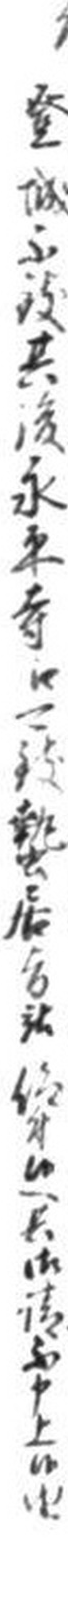登城不致其後永平寺江可致蟄居旨被仰付候へ共御請不申上候由
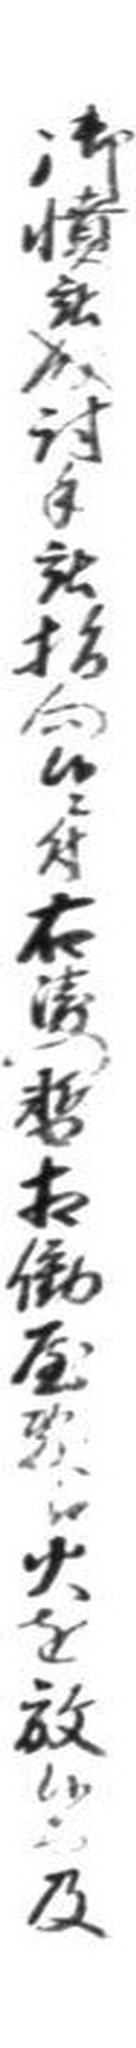御憤被成討手被指向候ニ付右衛門暫相働屋敷江火を放候而及
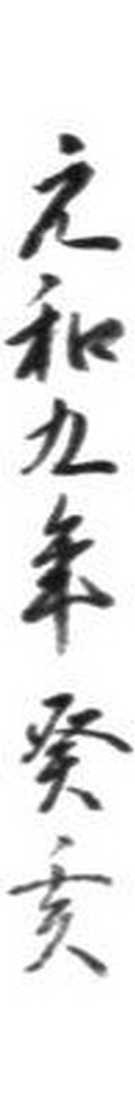元和九年癸亥
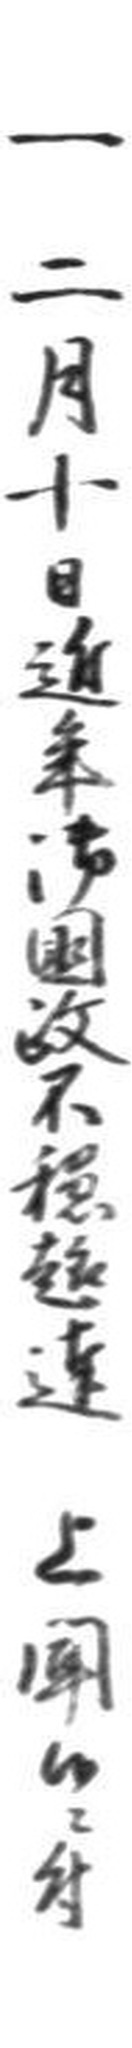一二月十日近年御国政不穏趣達上聞候ニ付
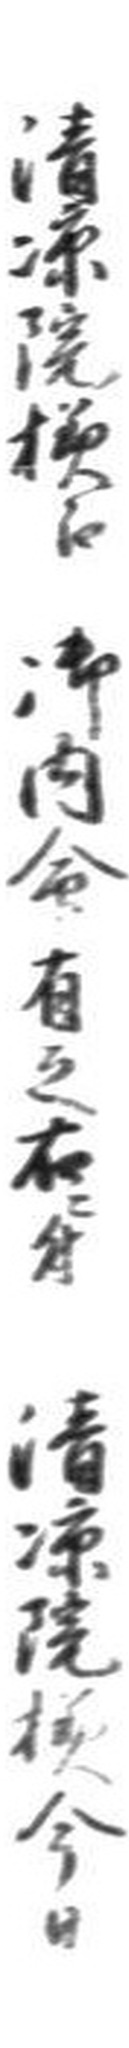清涼院様江御内命有之右ニ付清涼院様今日
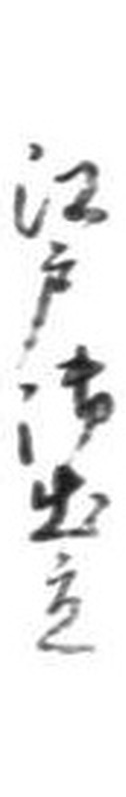江戸御出立
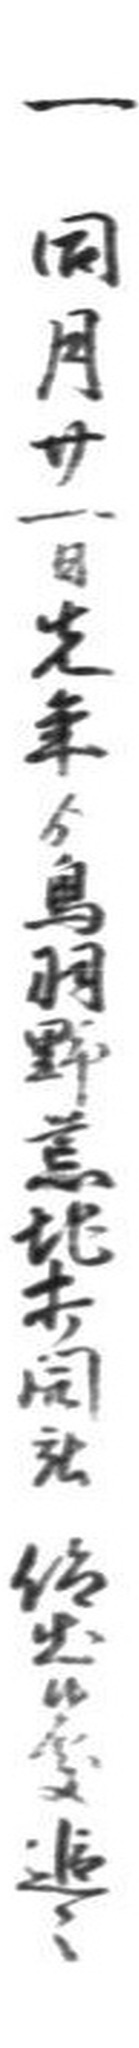一同月廿一日先年ゟ鳥羽野荒地打開被仰出候処追々
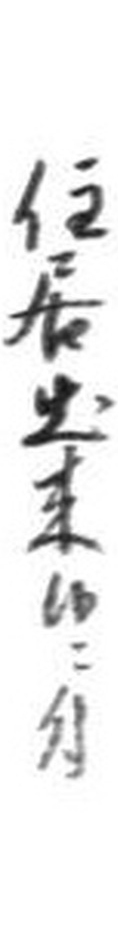住居出来候ニ付
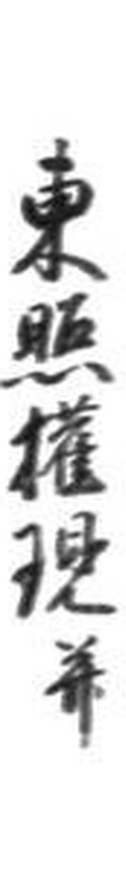東照権現并
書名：家譜 二 忠直公 従文禄四年到慶安四年
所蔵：福井県文書館 Fukui Prefectural Archives
